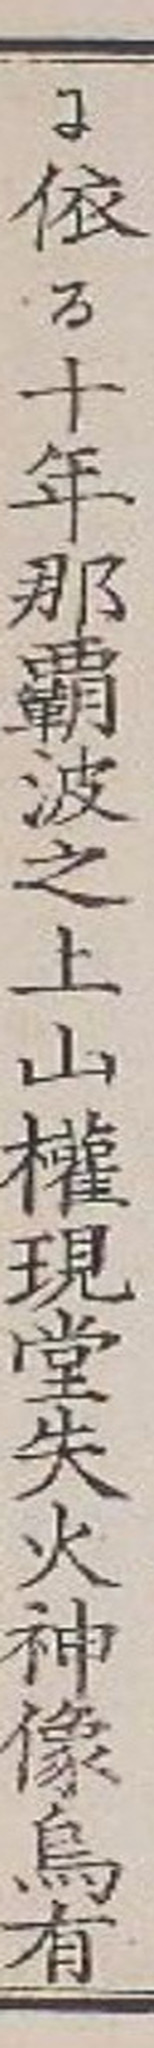に依る十年那覇波之上山権現堂失火神像烏有
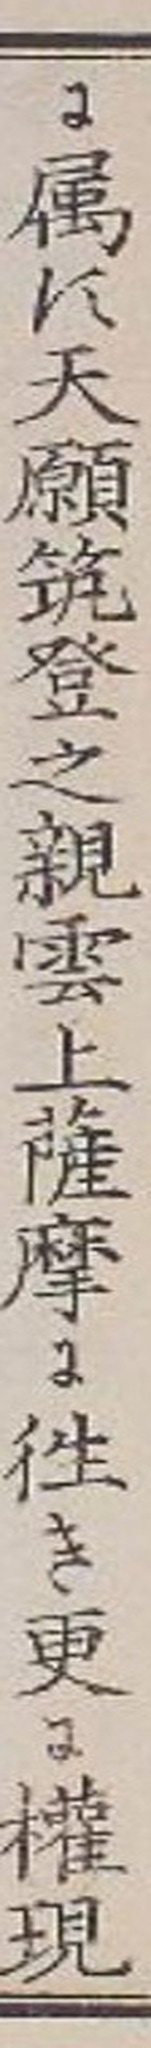に属す天願筑登之親雲上薩摩に往き更に権現
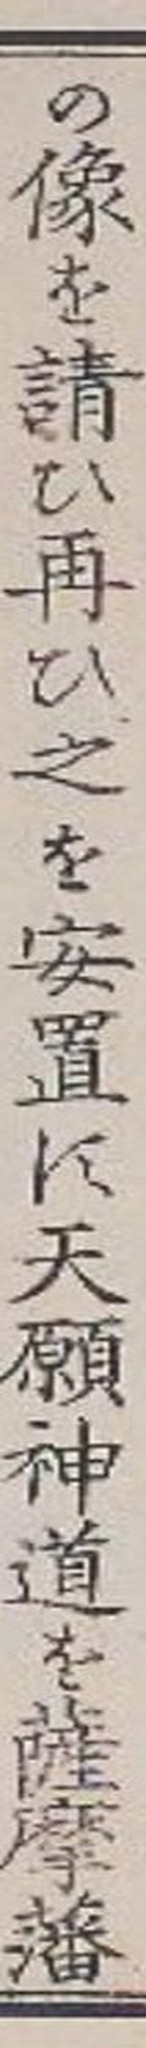の像を請ひ再ひ之を安置す天願神道を薩摩藩
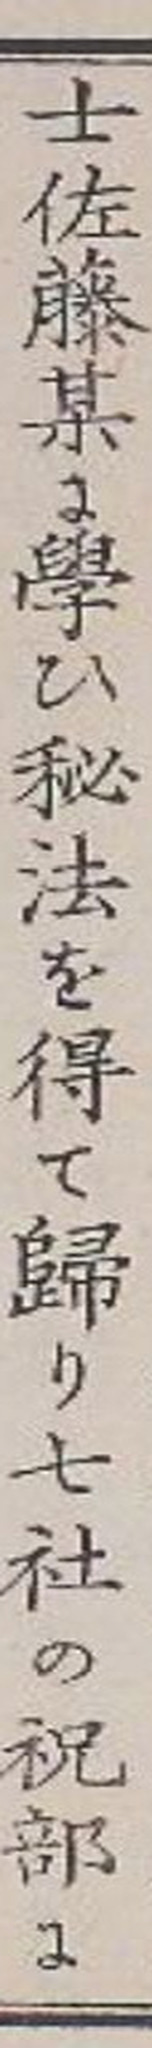士佐藤某に学ひ秘法を得て帰り七社の祝部に
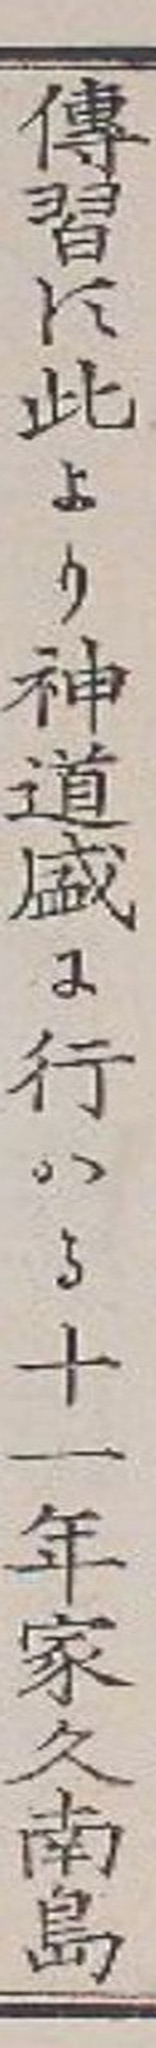伝習す此より神道盛に行はる十一年家久南島
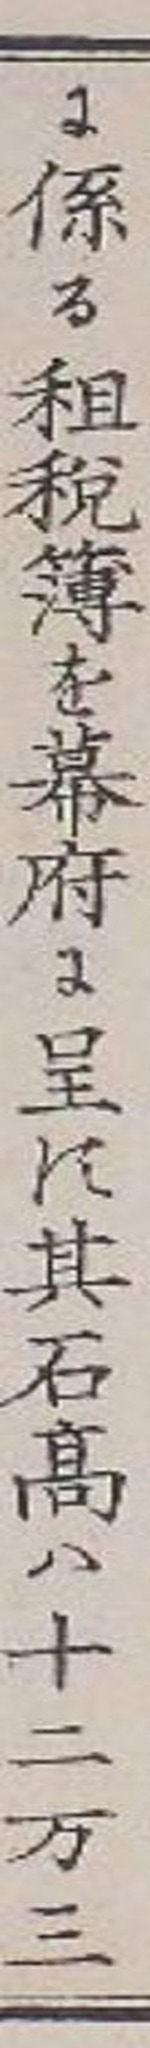に係る租税簿を幕府に呈す其石高は十二万三
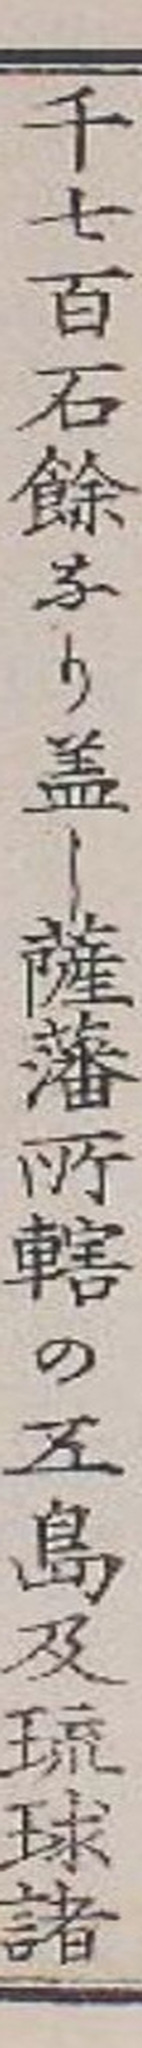千七百石余なり蓋し薩藩所轄の五島及琉球諸
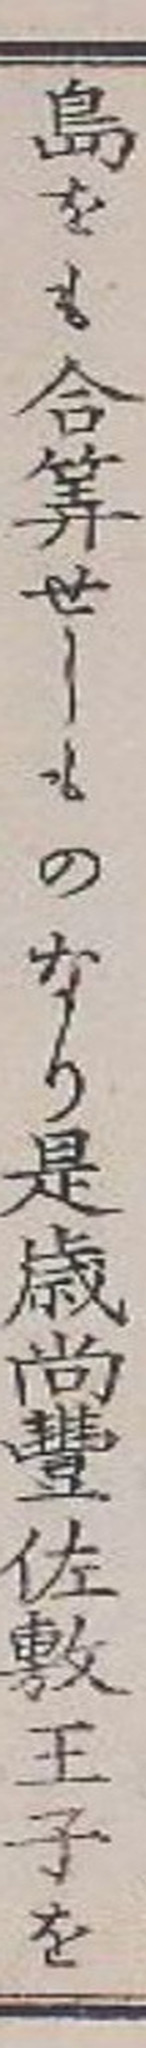島をも合算せしものなり是歳尚豊佐敷王子を
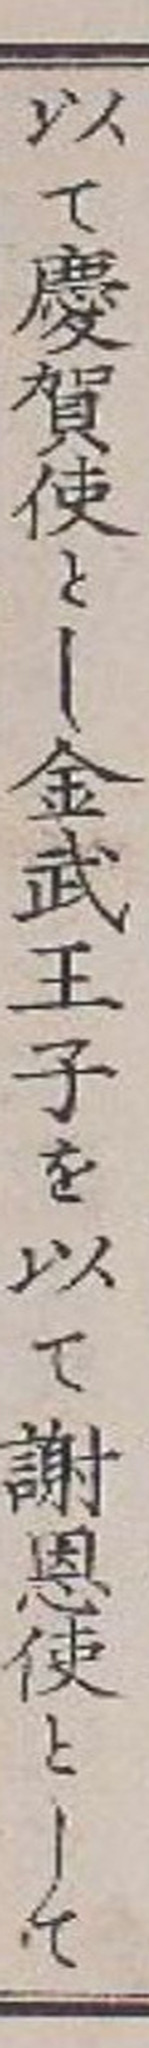以て慶賀使とし金武王子を以て謝恩使として

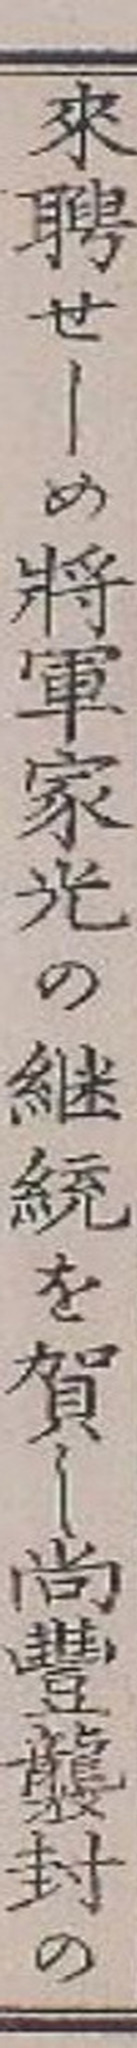来聘せしめ将軍家光の継統を賀し尚豊襲封の
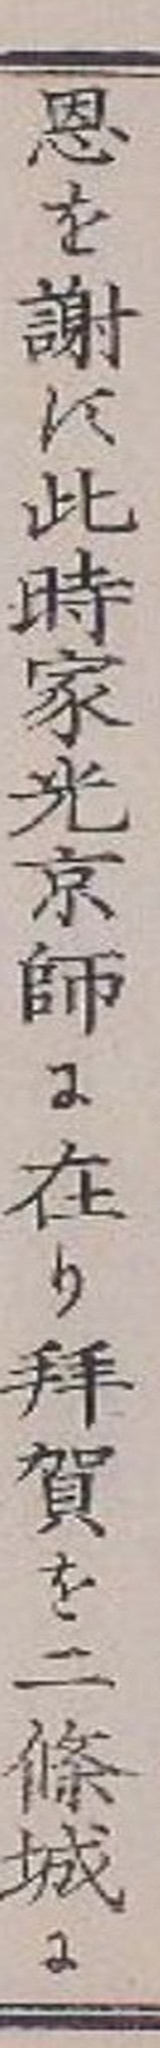恩を謝す此時家光京師に在り拝賀を二条城に
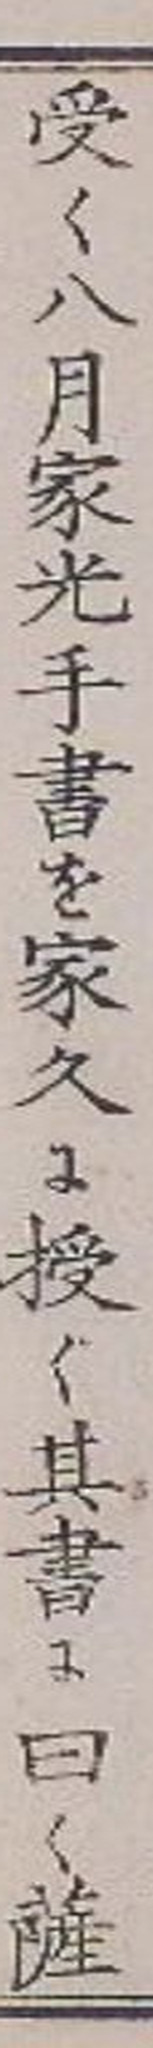受く八月家光手書を家久に授く其書に曰く薩
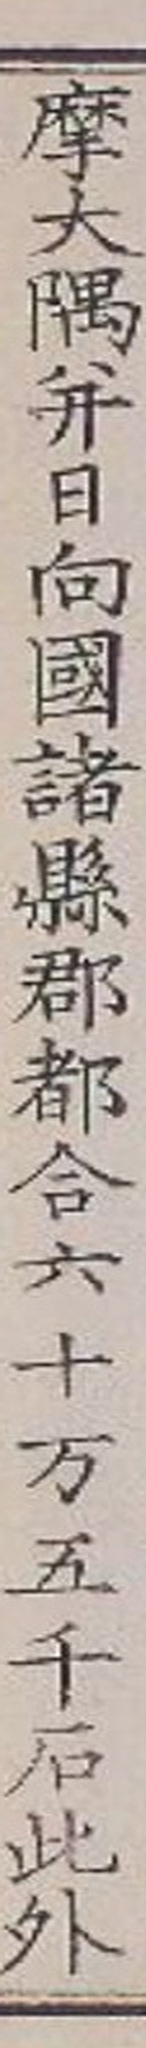摩大隅并日向国諸県群都合六十万五千石此外
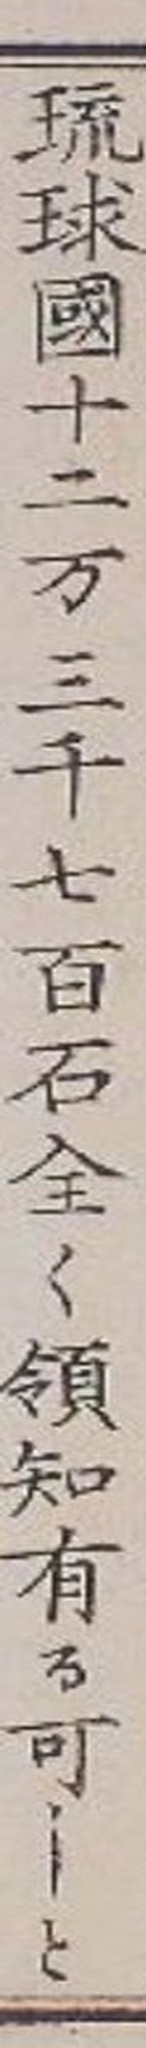琉球国十二万三千七百石全く領知有る可しと
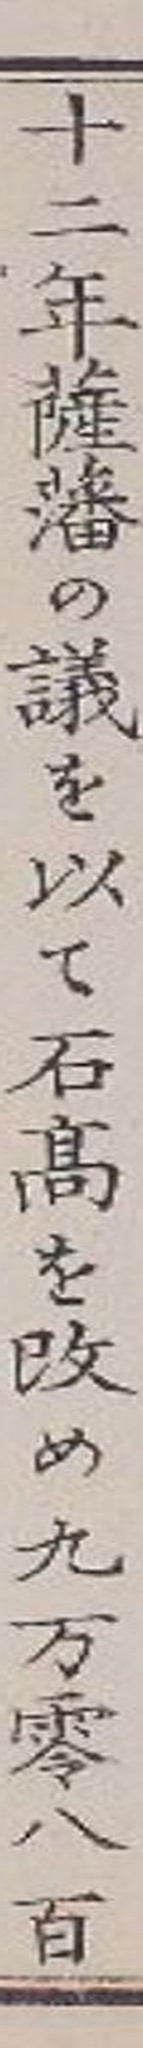十二年薩藩の議を以て石高を改め九万零八百
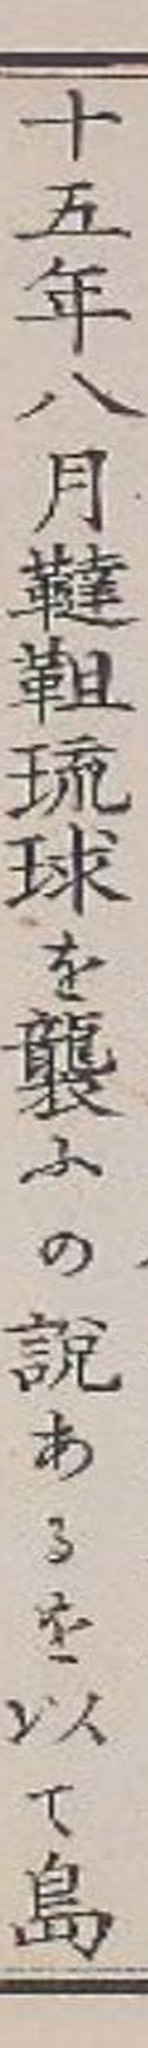十五年八月韃靼琉球を襲ふの説あるを以て島
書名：南島紀事 下
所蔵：University of the Ryukyus Library
